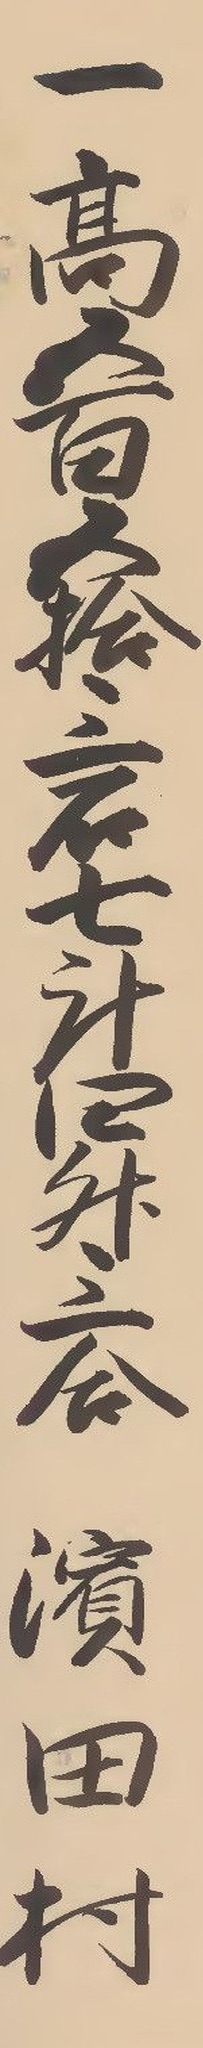一高五百五拾三石七斗四升三合浜田村
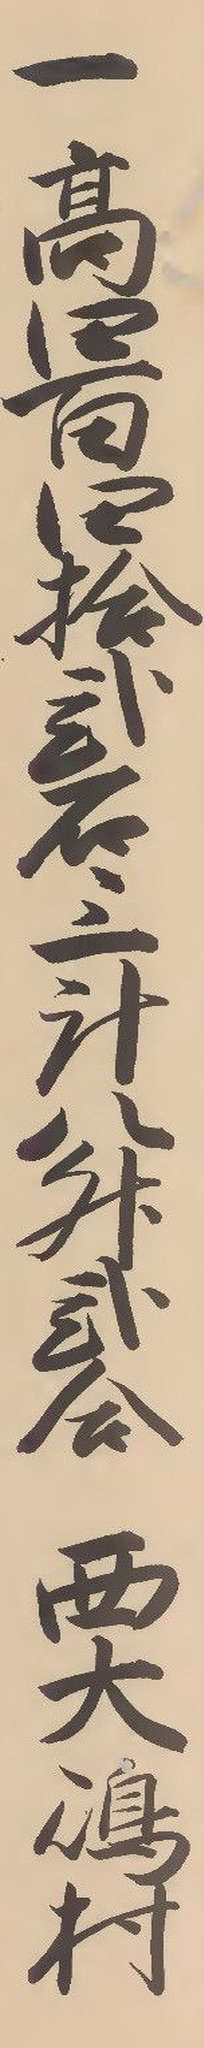一高四百四拾弐石三斗八升弐合西大島村
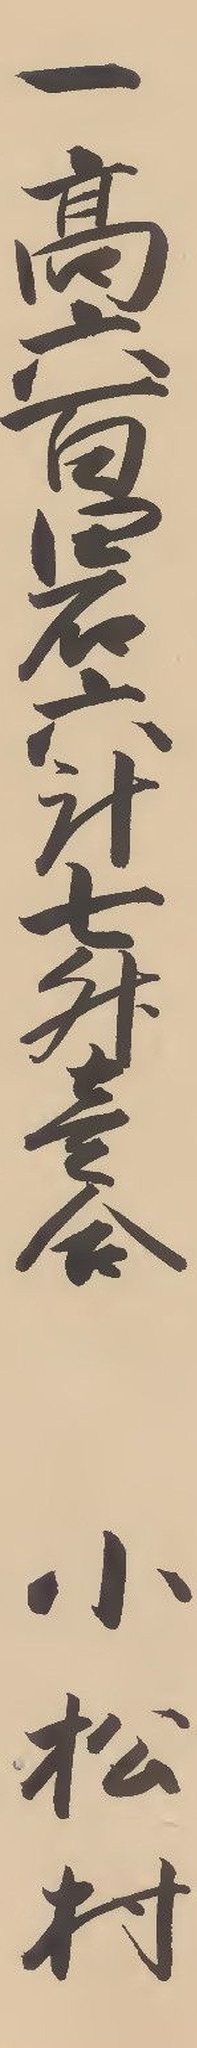一高六百四石六斗七升壱合小松村
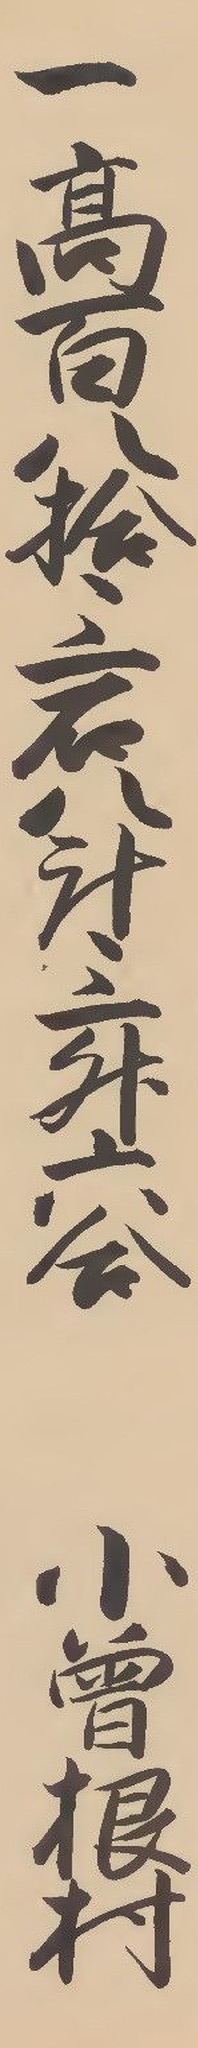一高百八拾三石八斗三升六合小曽根村
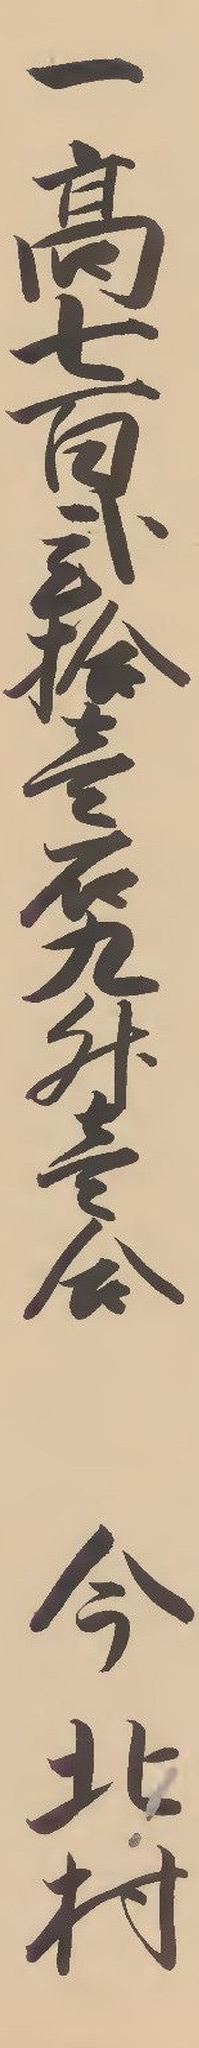一高七百弐拾壱石九升壱合今北村

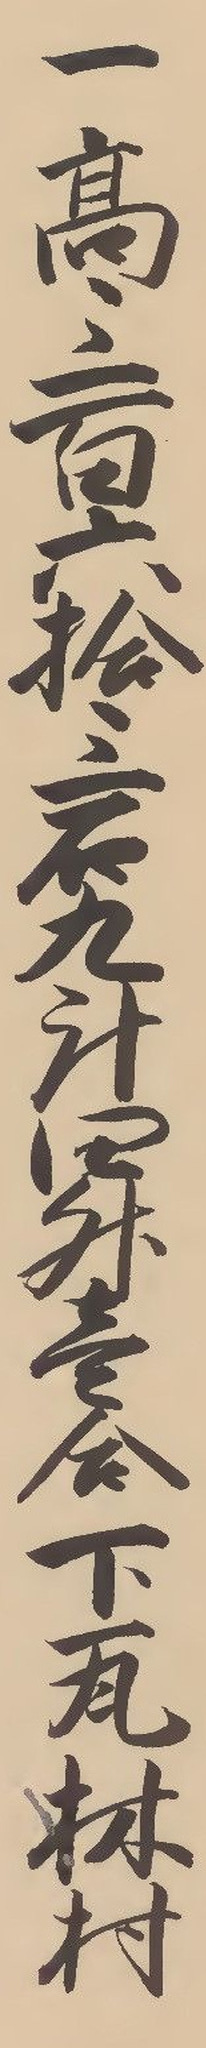一高三百六拾三石九斗四升壱合下瓦林村
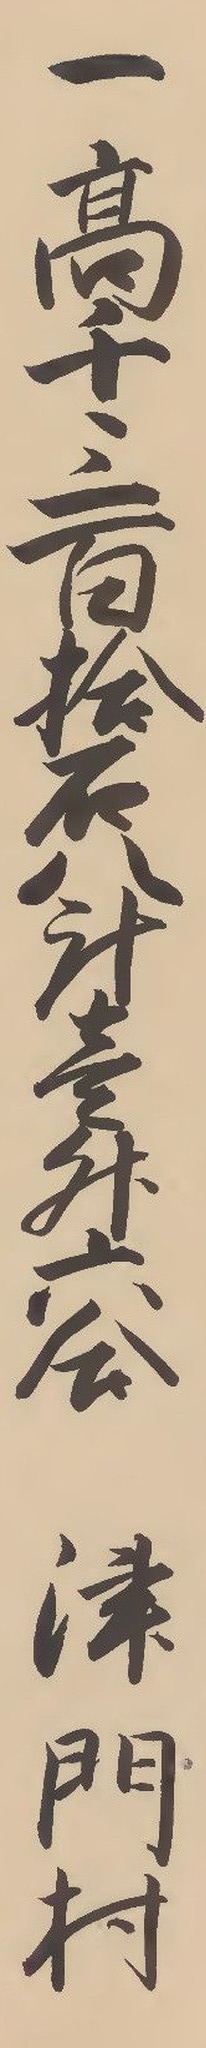一高千三百拾石八斗壱升六合津門村
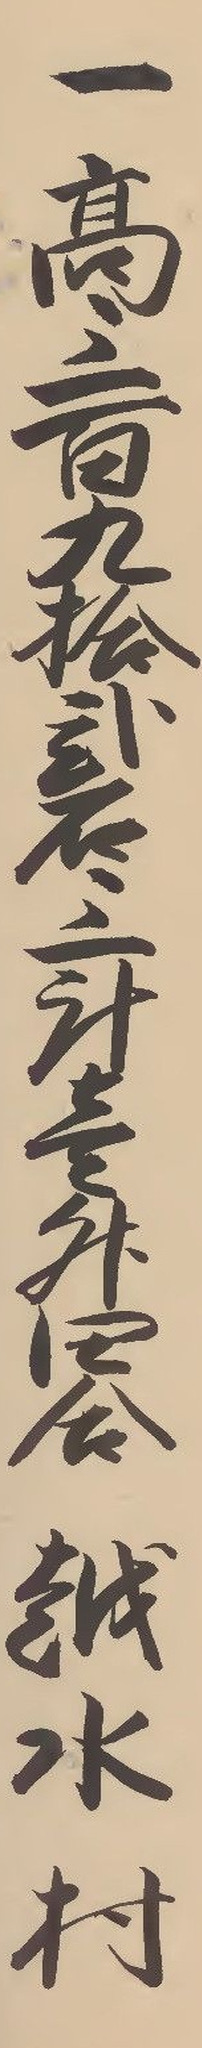一高三百九拾弐石三斗壱升四合越水村
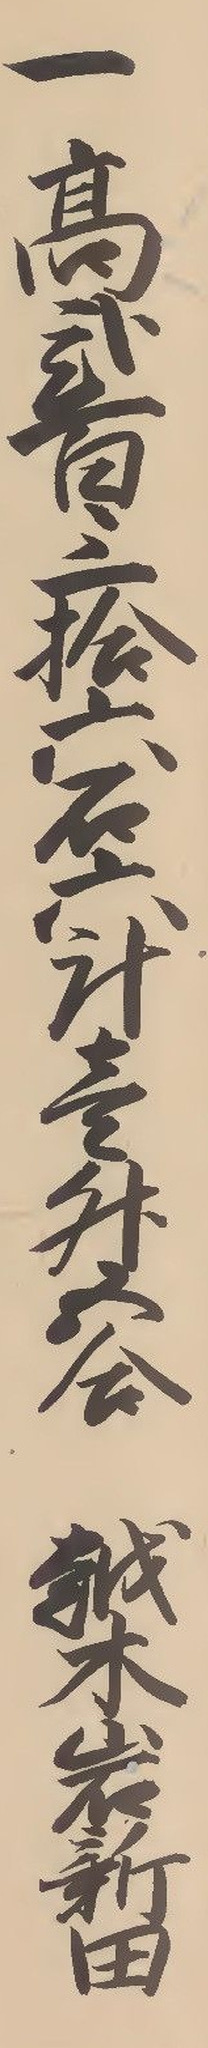一高弍百三拾六石六斗壱升五合越木岩新田
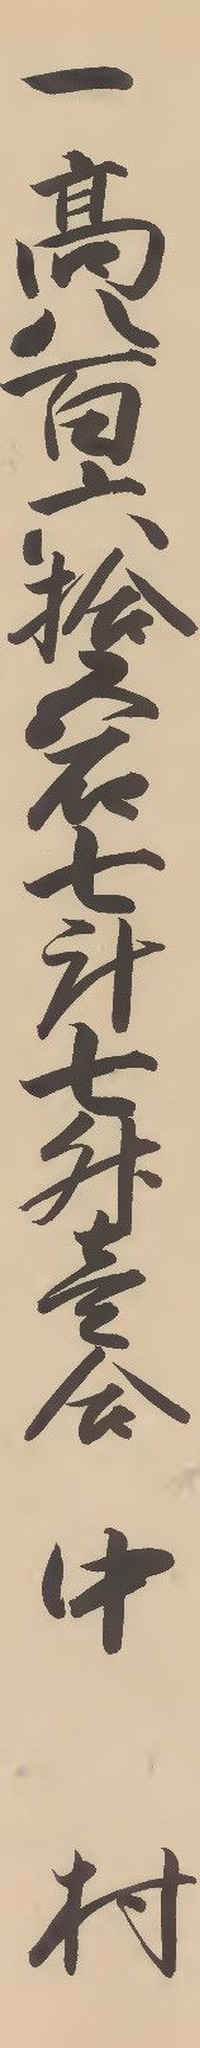一高八百六拾五石七斗七升壱合中村
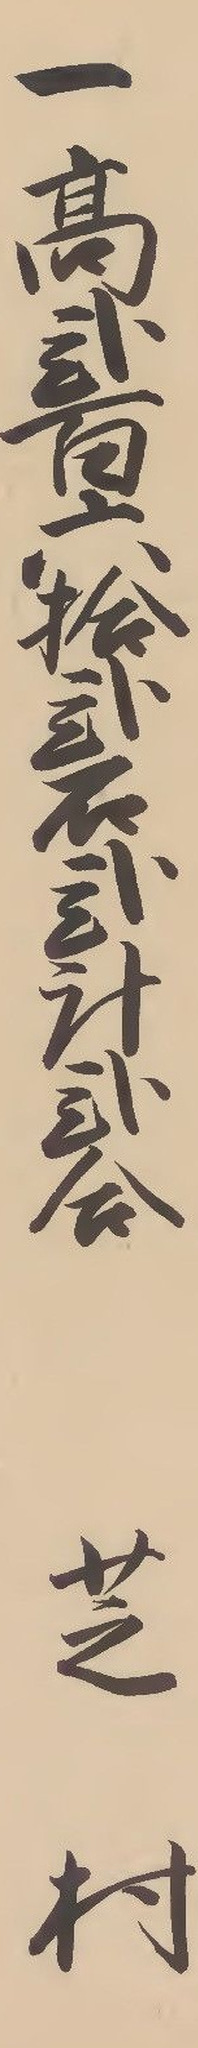一高弍百六拾弐石弐斗弐合芝村
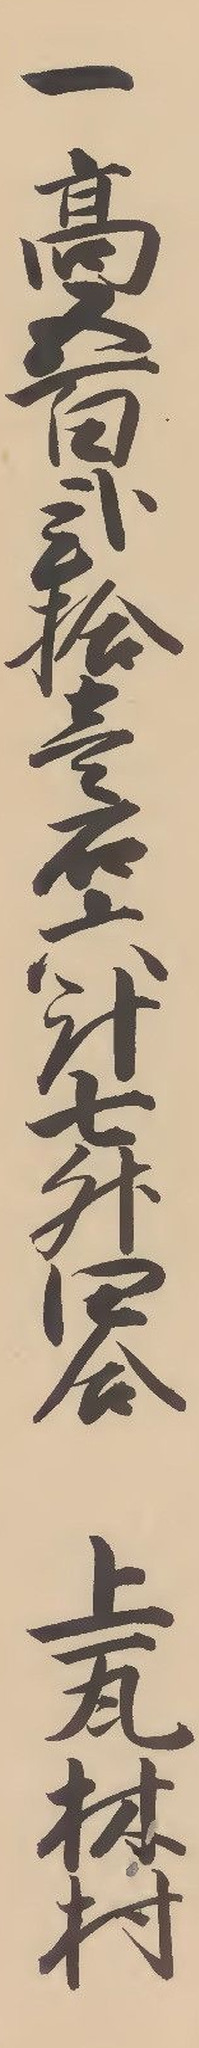一高五百弐拾壱石六斗七升四合上瓦林村

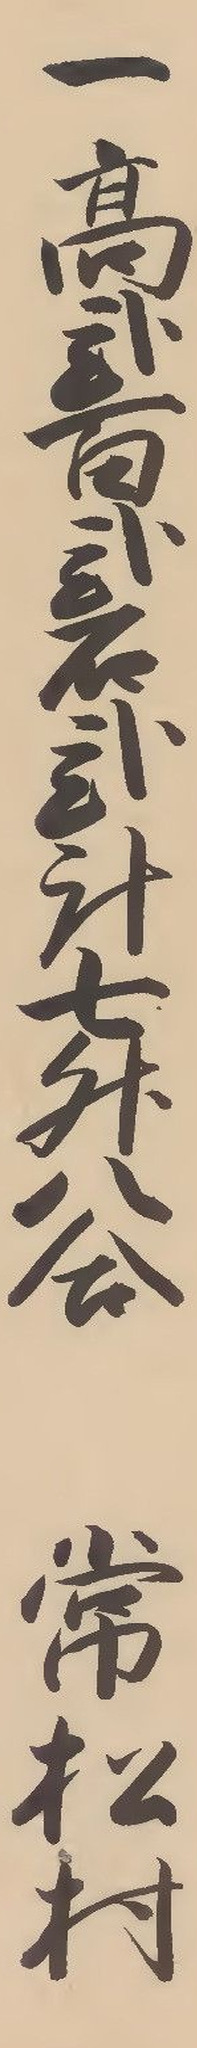一高弍百弍石弐斗七升八合常松村
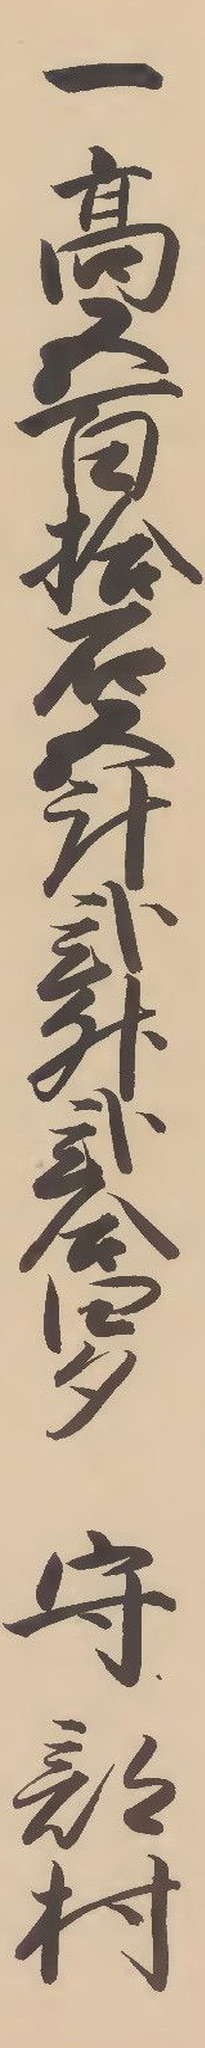一高五百拾石五斗弐升弍合四勺守部村
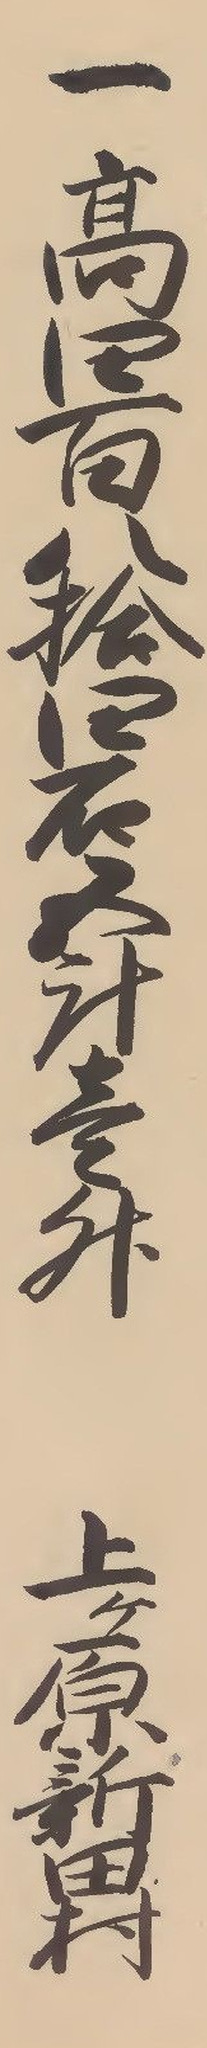一高四百八拾四石五斗壱升上ヶ原新田村
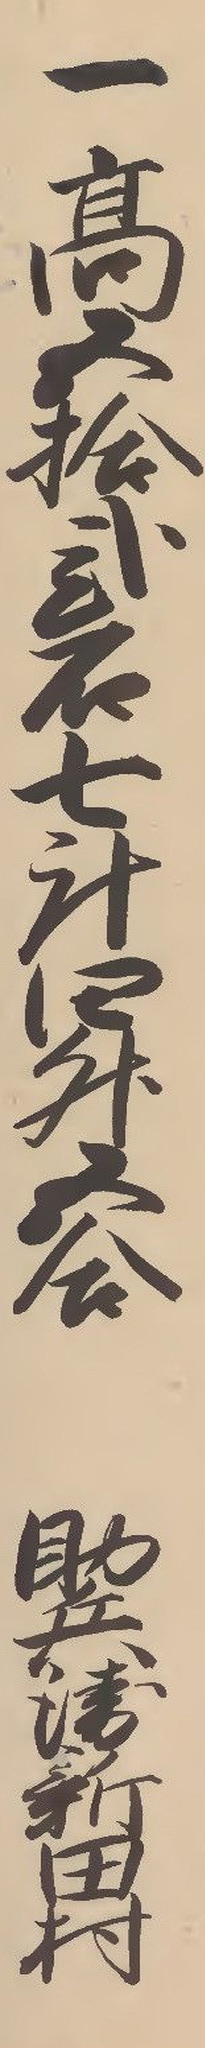一五拾弐石七斗四升五合助兵衛新田村
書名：摂津国郷帳
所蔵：国立公文書館 National Archives of Japan
